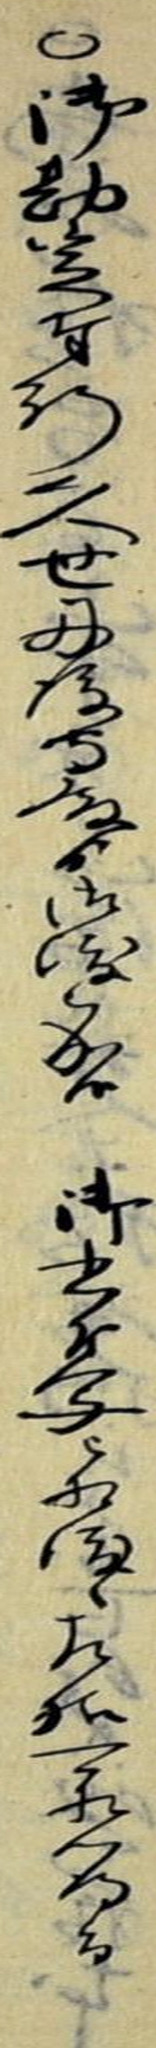〇御勘定奉行久世丹後守殿ゟ御渡被成候御書付写被相渡候左様可相心得旨
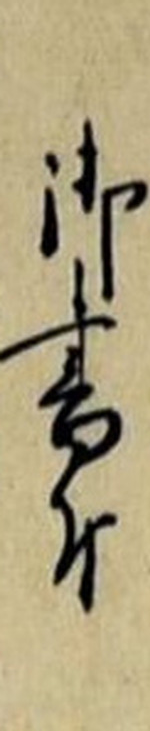御書付
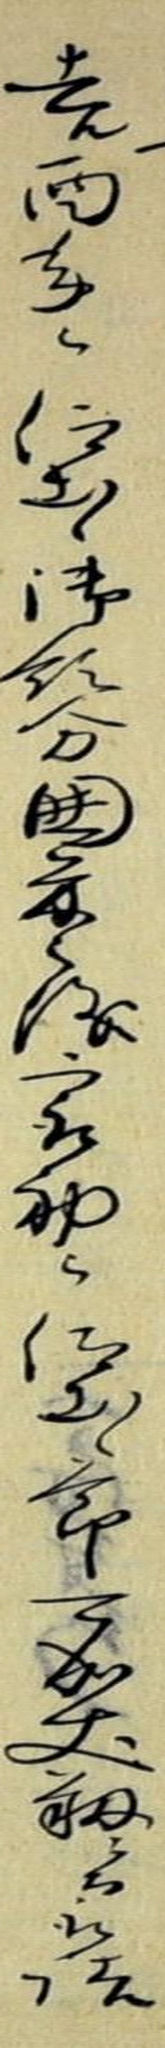去ル酉年被仰出候御領分囲米之儀最初被仰出候節可成丈籾ニ而取詰
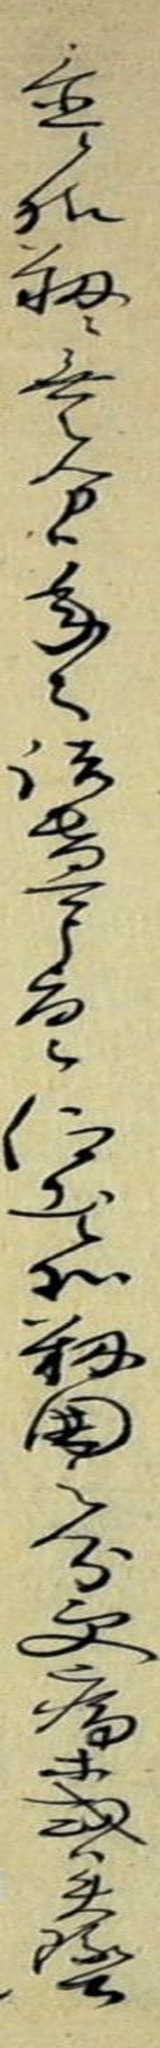置候様籾ニ無之分ハ年々詰替可申旨被仰出候処籾囲之分受病等或ハ失墜
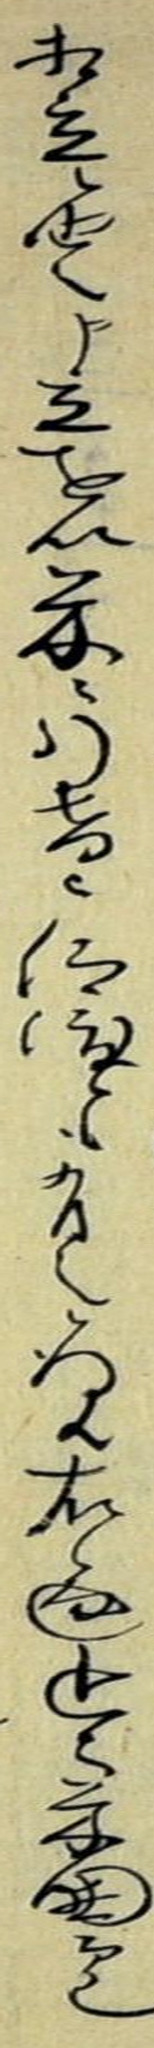相立候由之申立を以米ニ引替被仰渡候も有之候得共右之通追々米囲而已
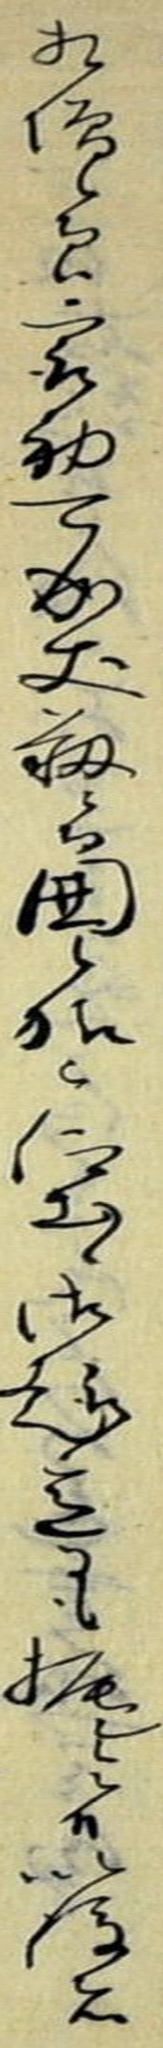相増候而ハ最初可成丈籾ニ而囲候様被仰出候御趣意にも振レ候ニ付以後者
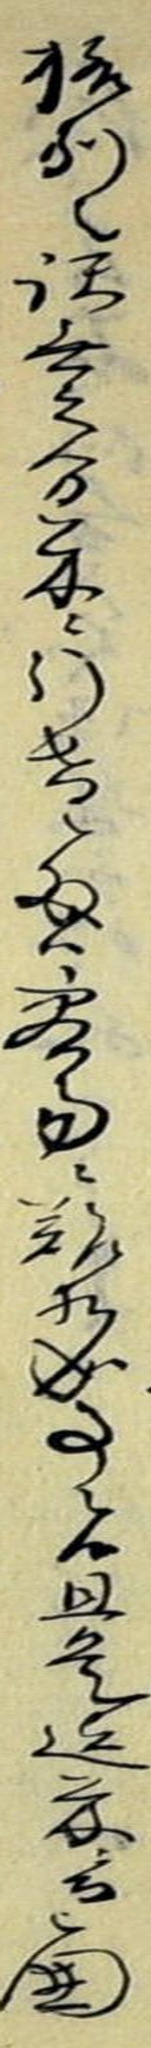格別之訳無之分米ニ引替候義ハ容易ニ難相成事ニ候且是迄米ニ而被囲
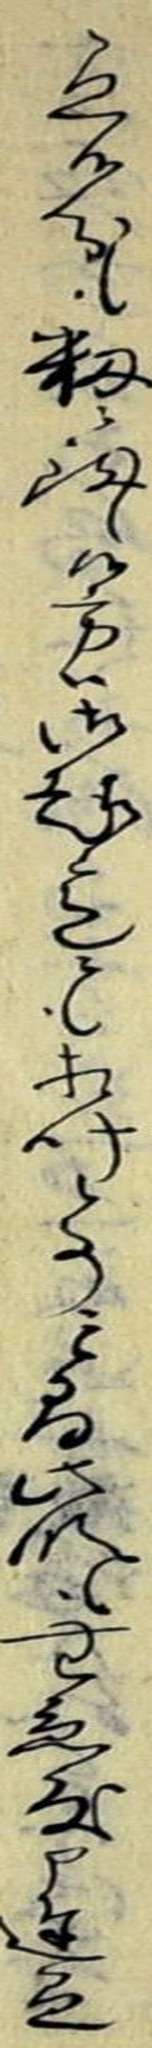置候分も籾ニ致し候方ハ御趣意ニも相叶候事ニ候間此段も無急度申達置
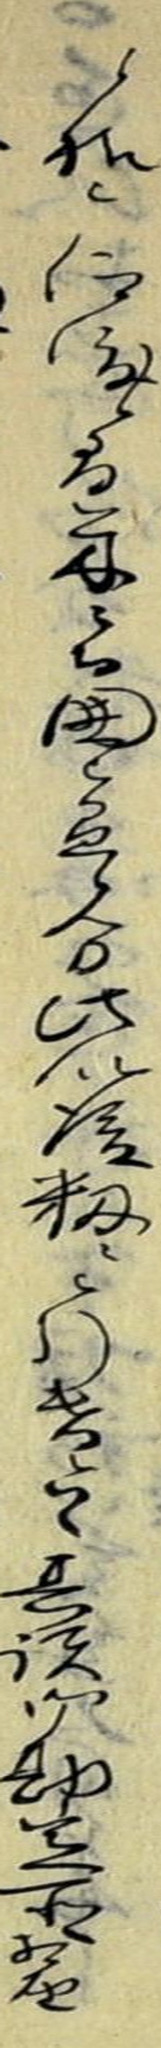候様被仰渡候間米ニ而囲被置候分此以後籾ニ被引替候ハヽ其訳御勘定所へ相届
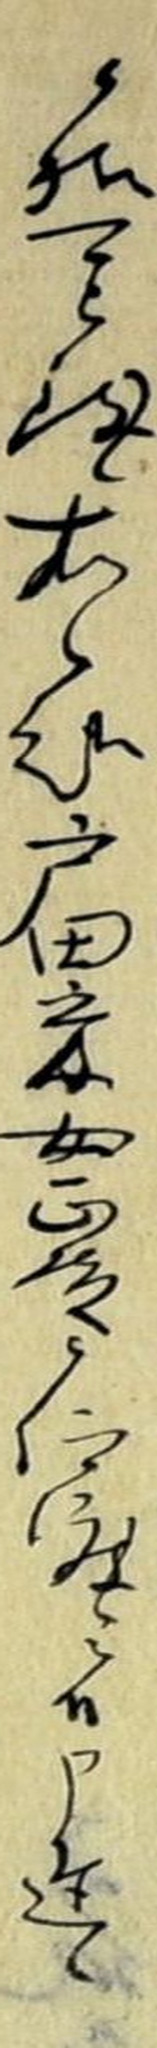候様可被致候右之趣戸田采女正殿へ被仰渡候ニ付申達候
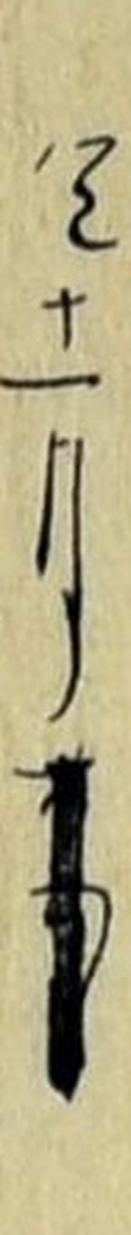閏十一月廿五日
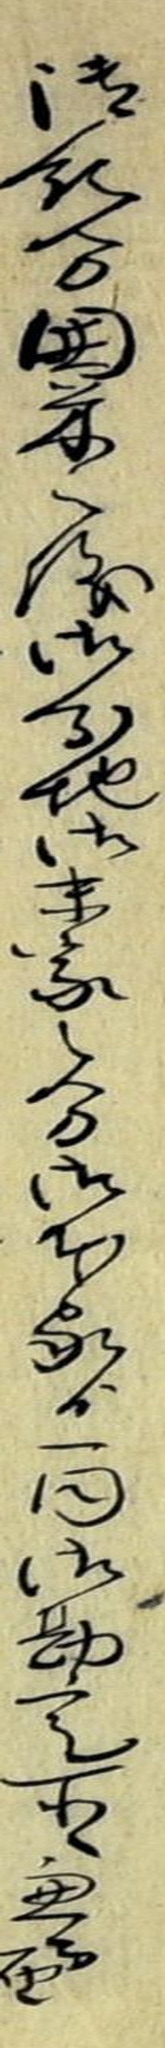御領分囲米之儀御分地御末家之分御本家ゟ一同御勘定所へ兼而届
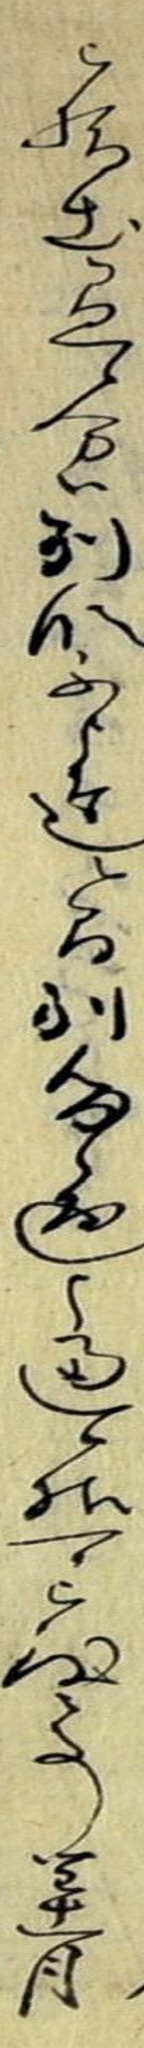被指出置候分ハ別段不申達候間別紙之通申通候様可被致候事閏十一月
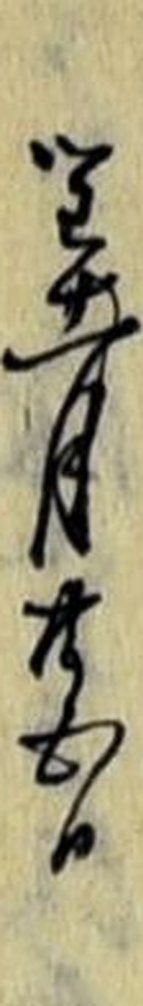閏十一月廿五日

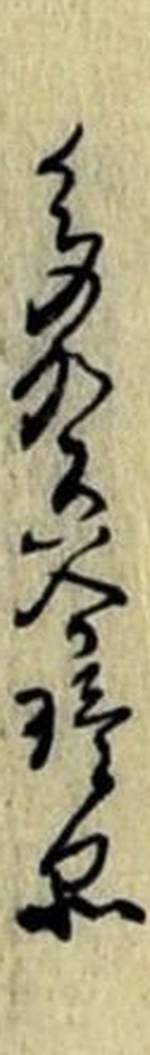多賀谷権兵衛
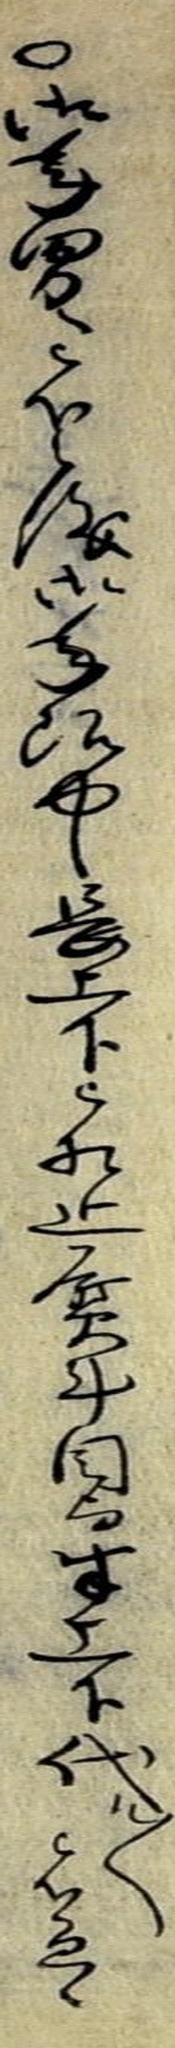〇御年男へ被下之儀御年限中長上下被相止熨斗目与半上下代ル〳〵被下置候
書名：命令之部 三
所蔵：福井県文書館 Fukui Prefectural Archives
